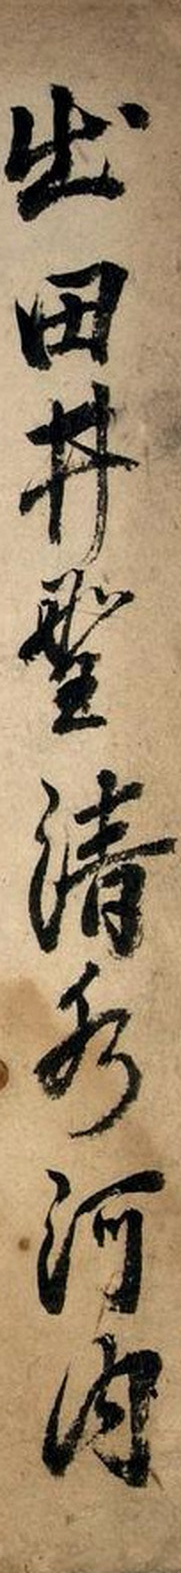出田井野清水河内
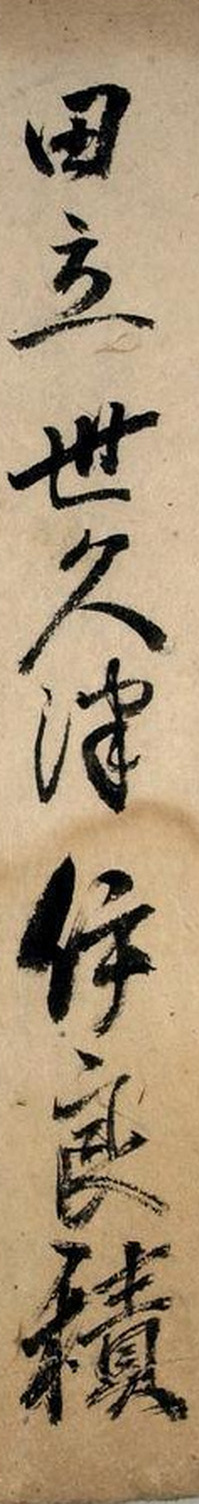田立世久津伊良積
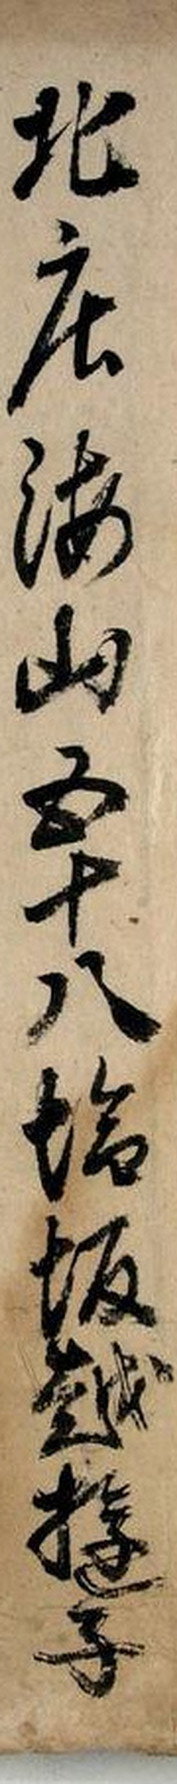北庄海山五十八塩坂越遊子
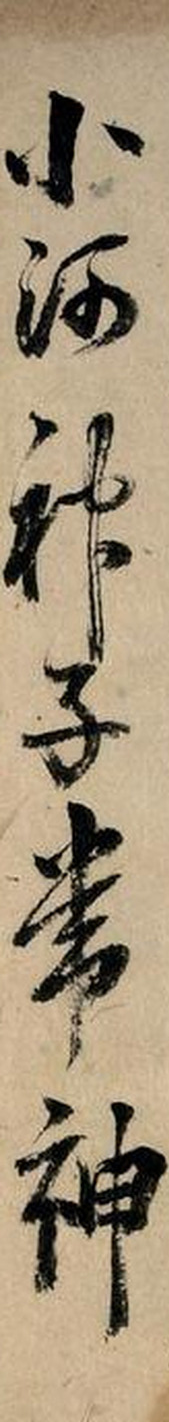小河神子常神
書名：邑名手本（手習）
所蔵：福井県文書館 Fukui Prefectural Archives
